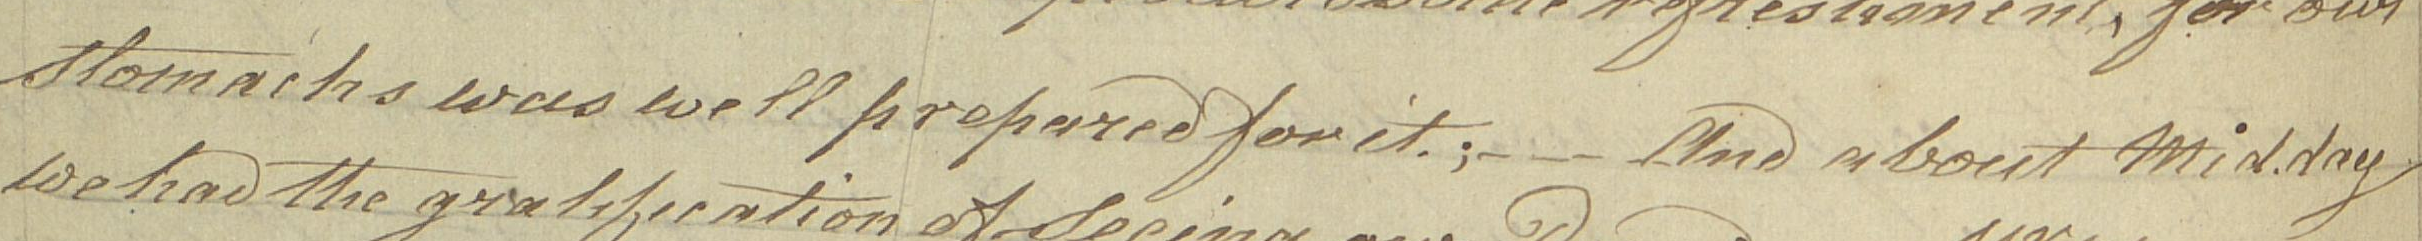stomachs was well prepared for it; And about Midday
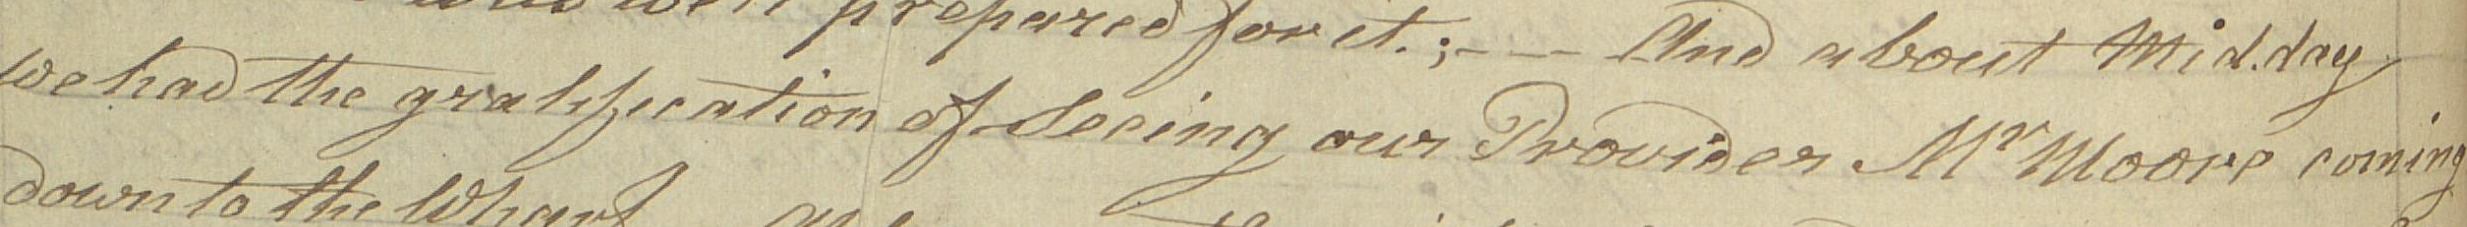we had the gratification of Seeing our Provider M^r Moore coming
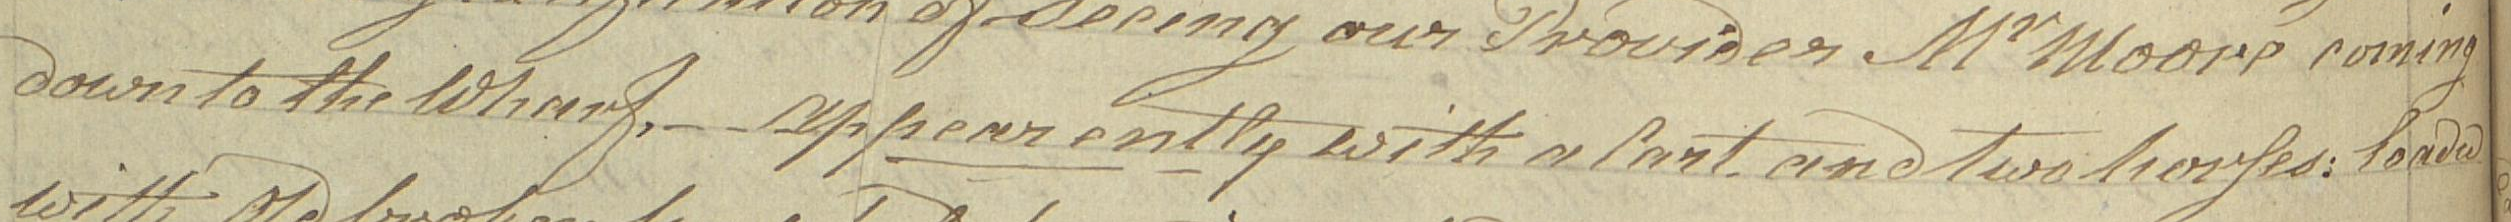down to the Wharf. Appearently with a Cart and two horses: loaded
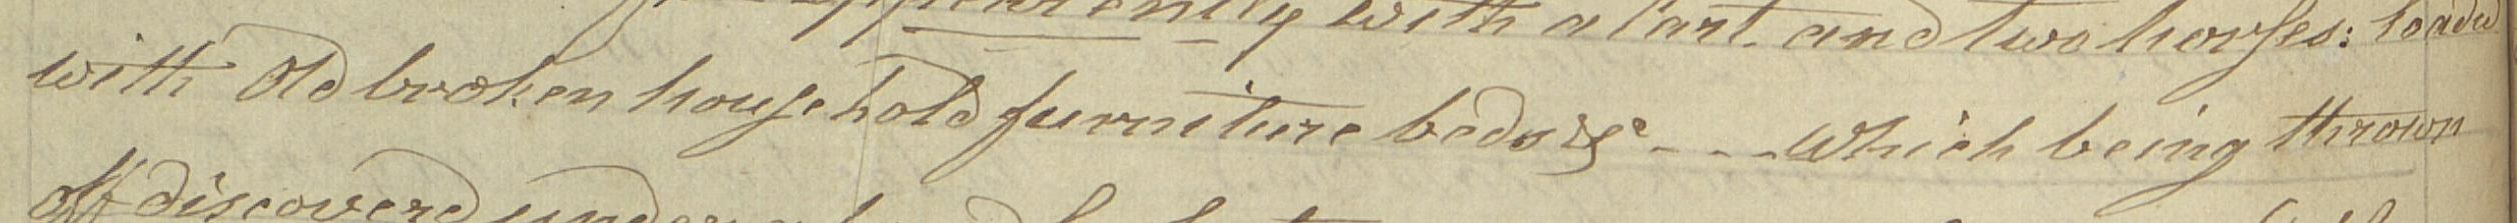witth Old broken household furniture bed, & Which being thrown
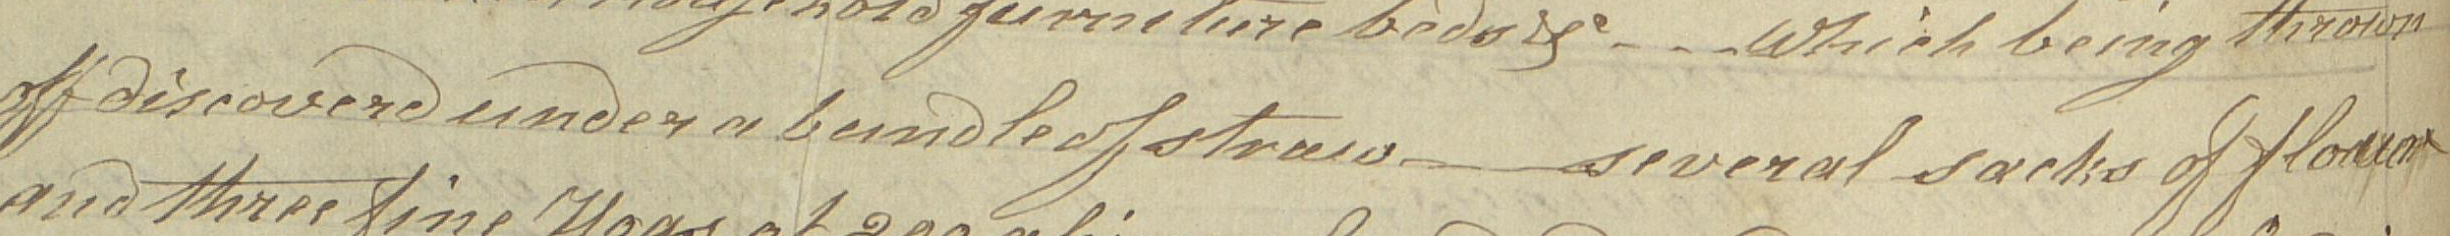off discoverd under a bundle of straw several sacks of flour
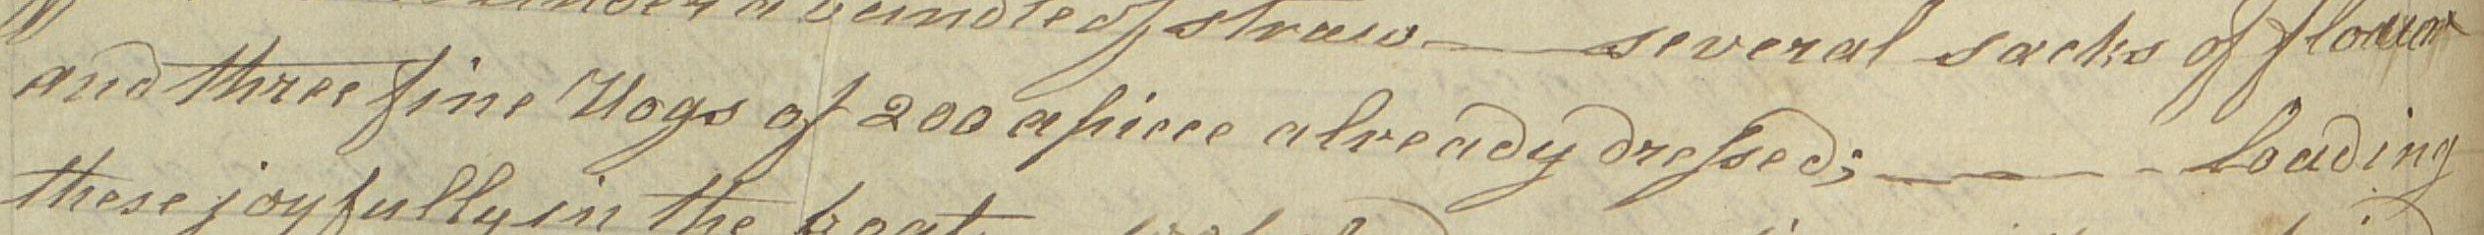and three fine Hogs of 200 apiece already dressed; loading
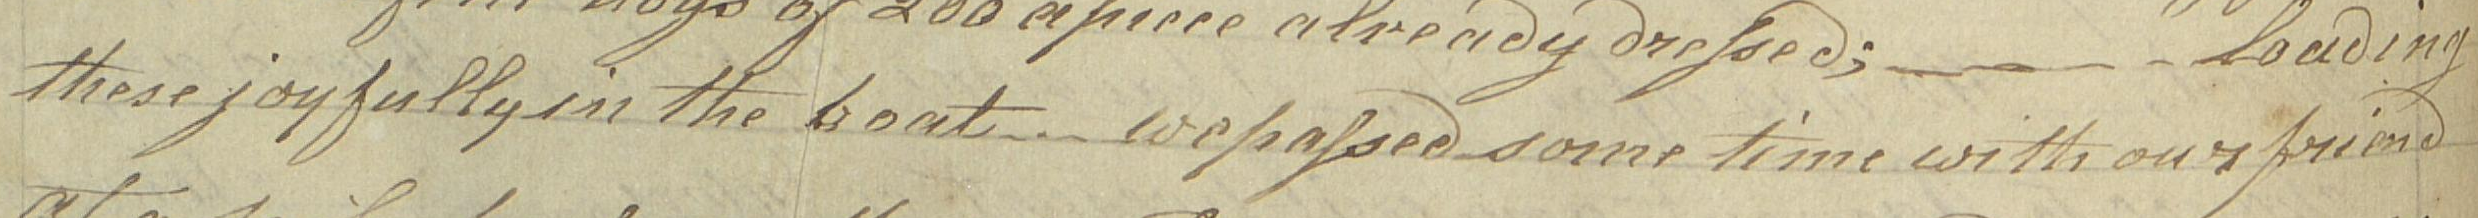these joyfully in the boat. We passed some time with our friend
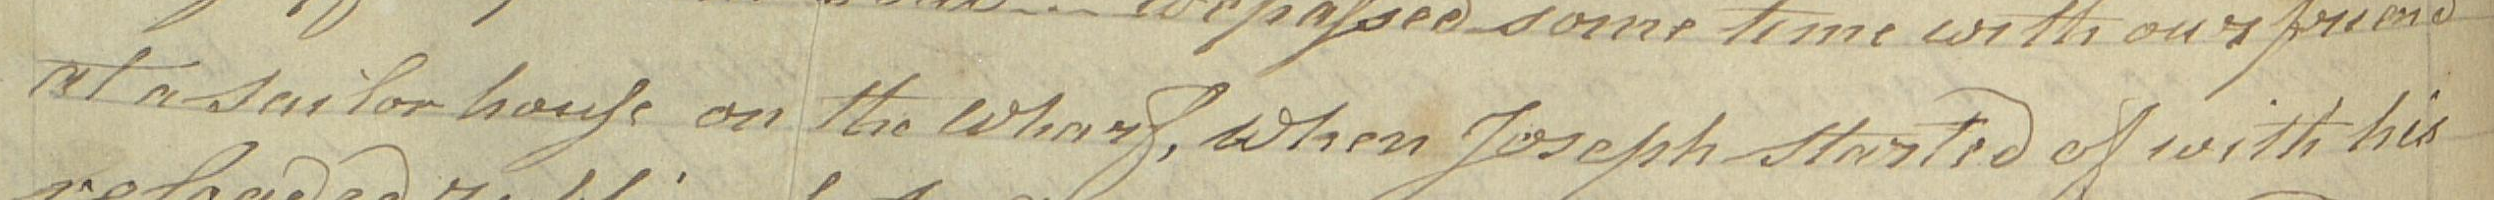at a sailor house on the Wharf, when Joseph started of with his
